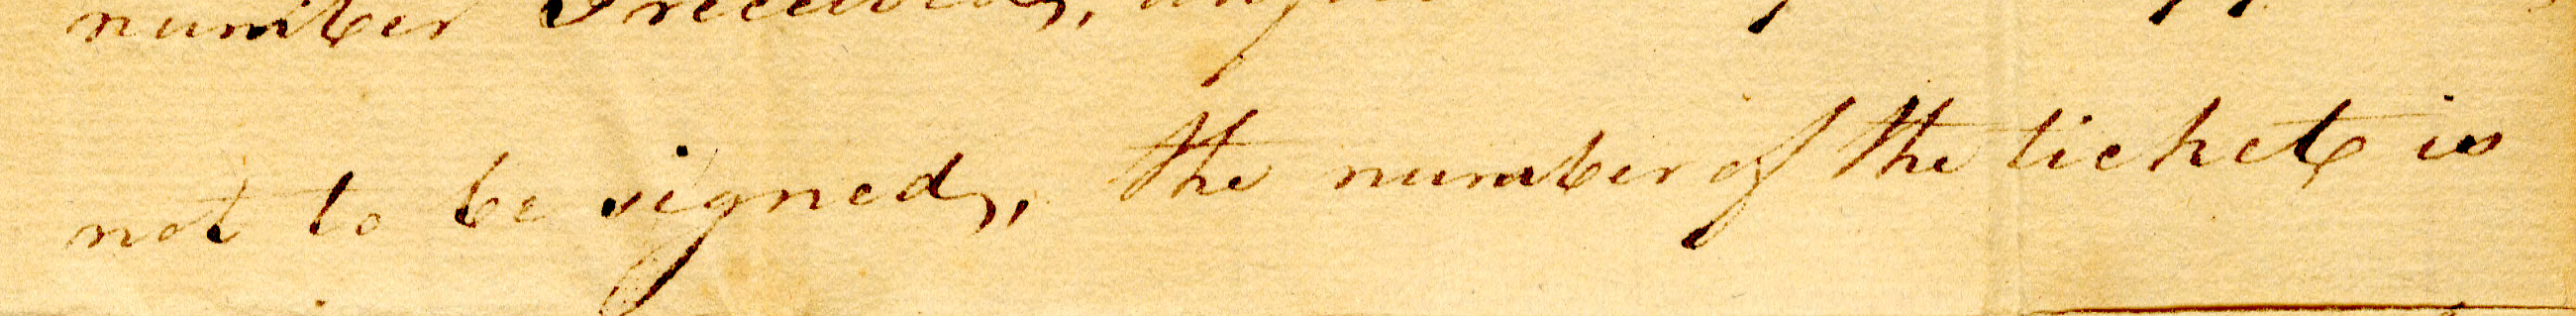not to be signed, the number of the ticket is
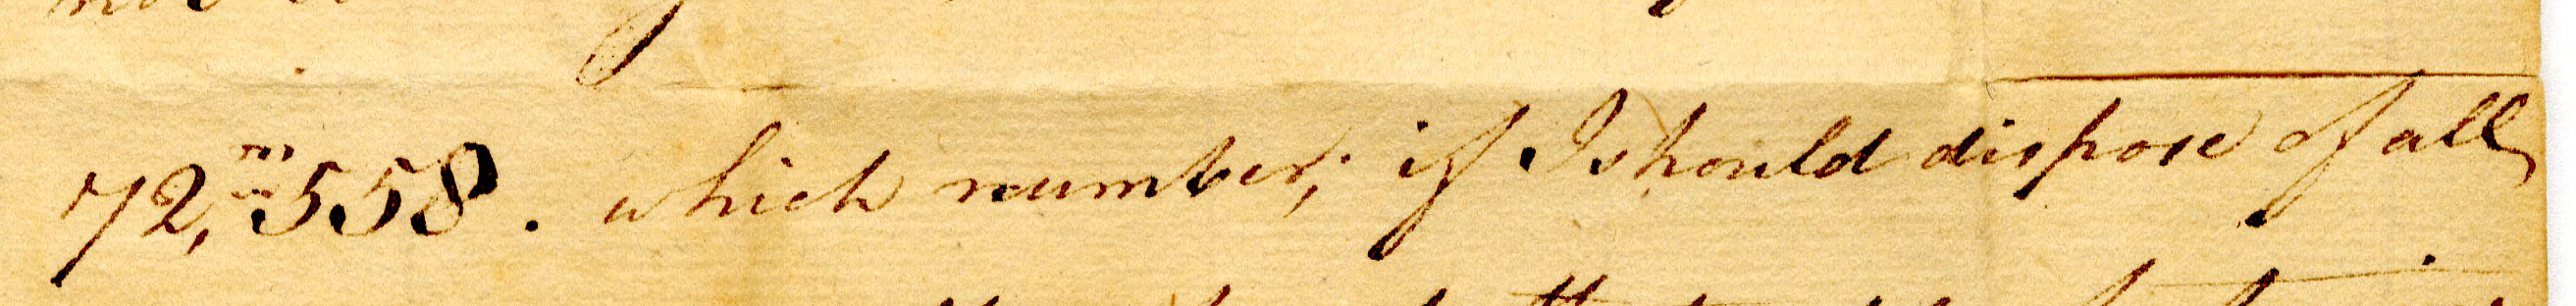72,^m558. which number; if I should dispose of all
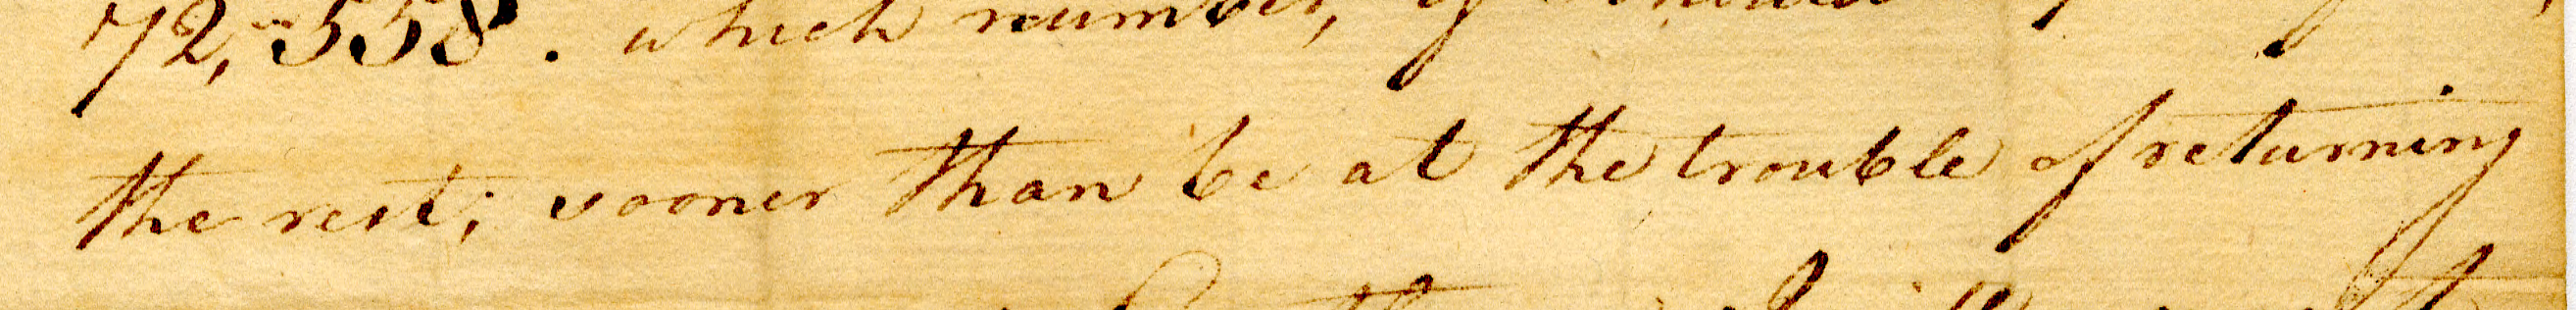the rest; sooner than be at the trouble of returning
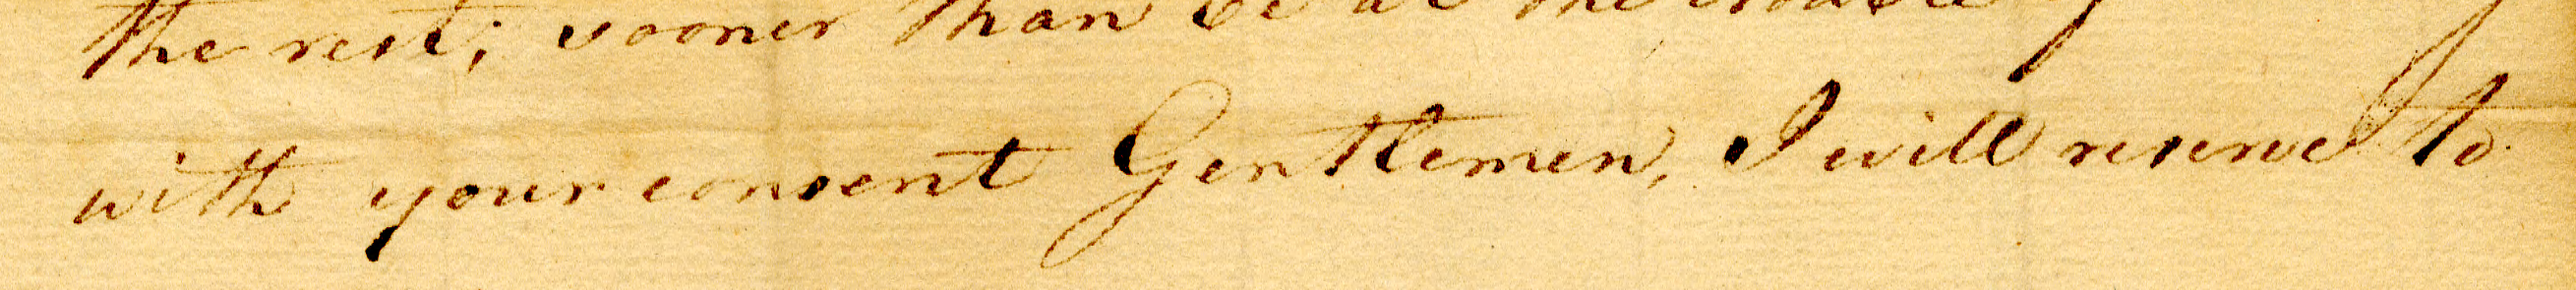with your consent Gentlemen, I will reserve to
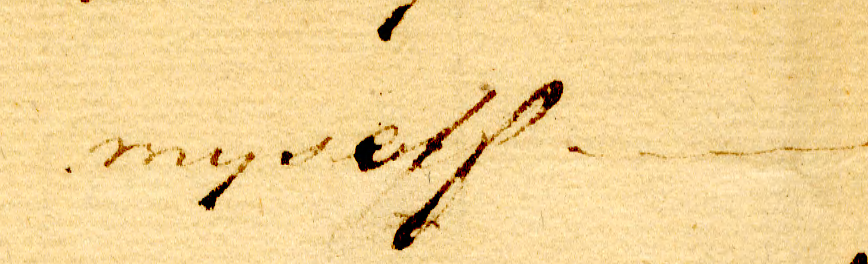myself.-
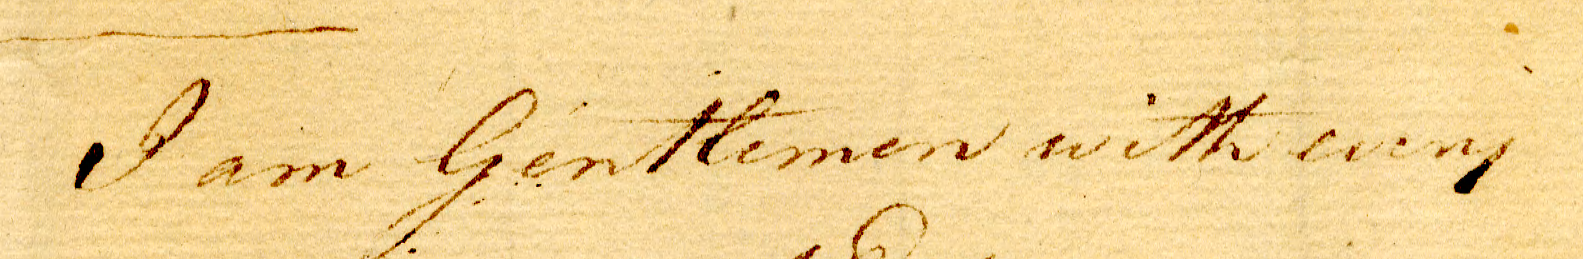I am Gentlemen with every
